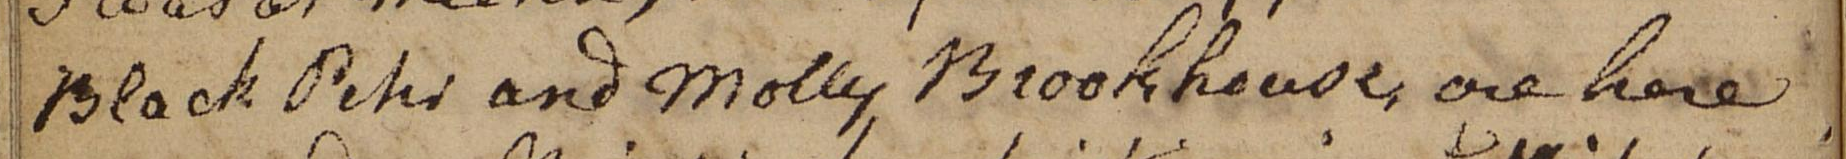Black Peter and Molly Brookhouse, are here
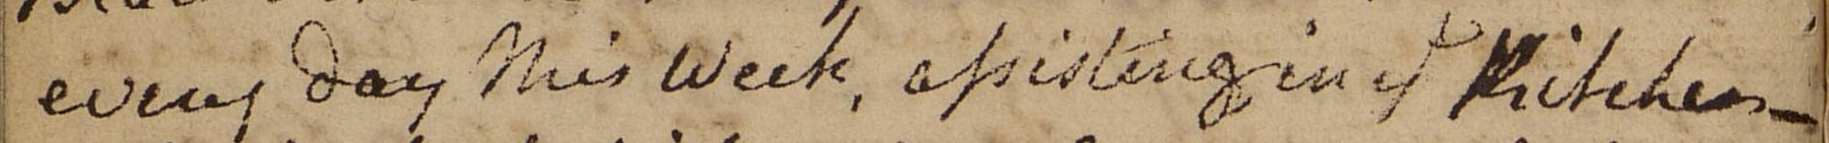eveng day this Week, assisting y^e Kitchen-
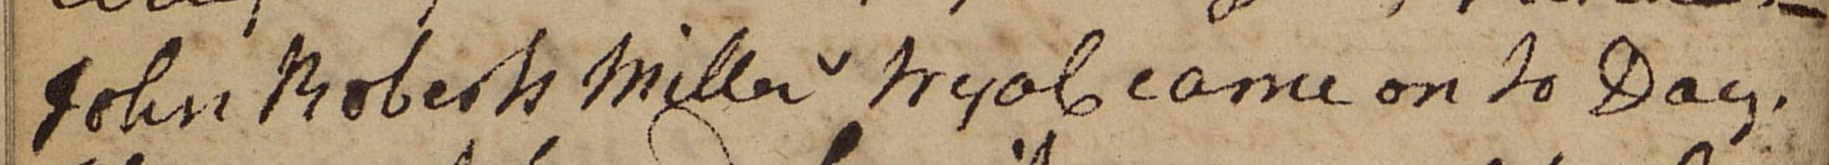John Roberts Miller^s tryal came on to Day,
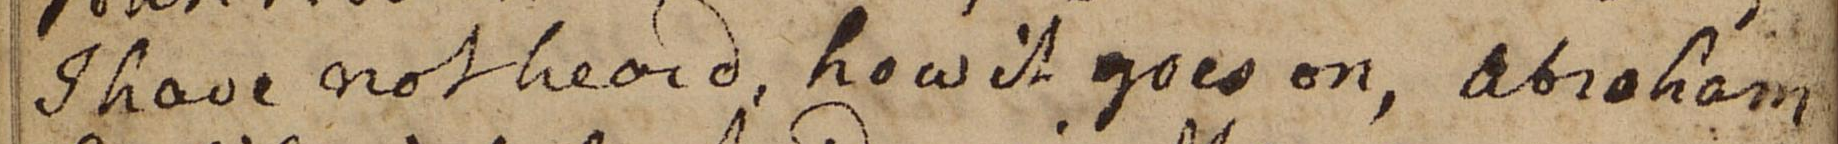I have not heard, how it goes on, Abraham
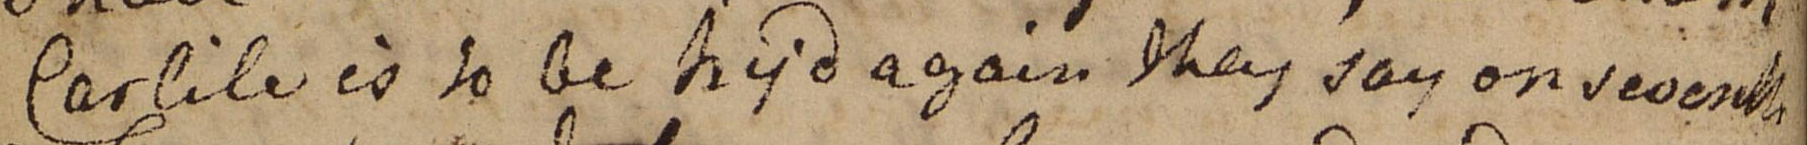Carlile is to be try'd again they say on seventh
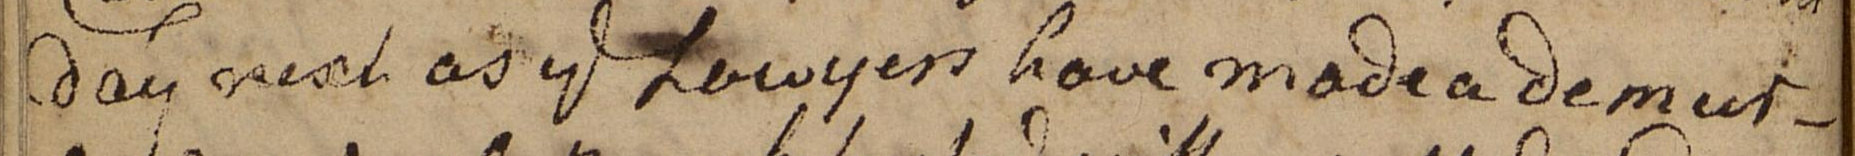day next as y^e Lawyers have made a demur-
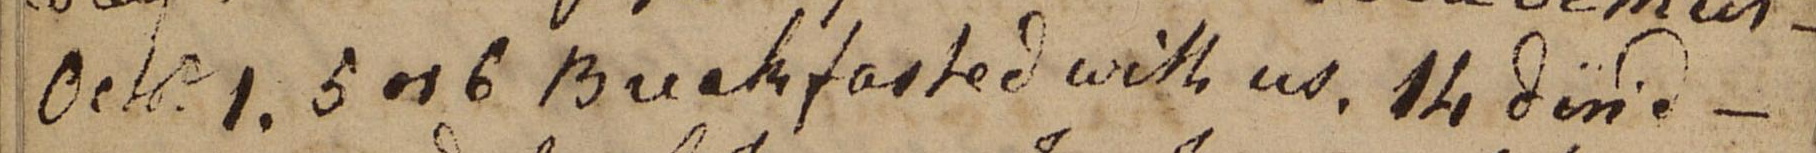Oct^r. 1, 5 or 6 Breakfasted with us. 14 din'd-
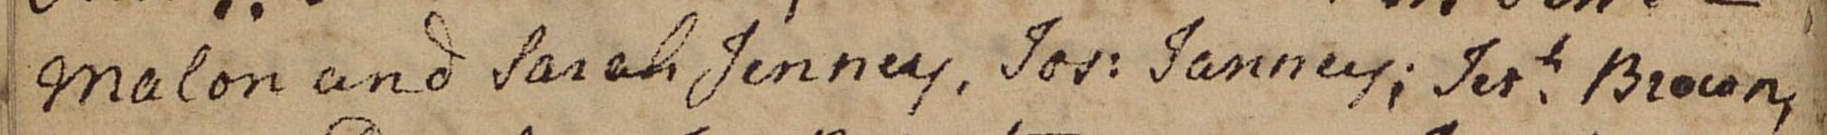Malon and Sarah Jenney, Jos: Janney; Jer^h. Brown,
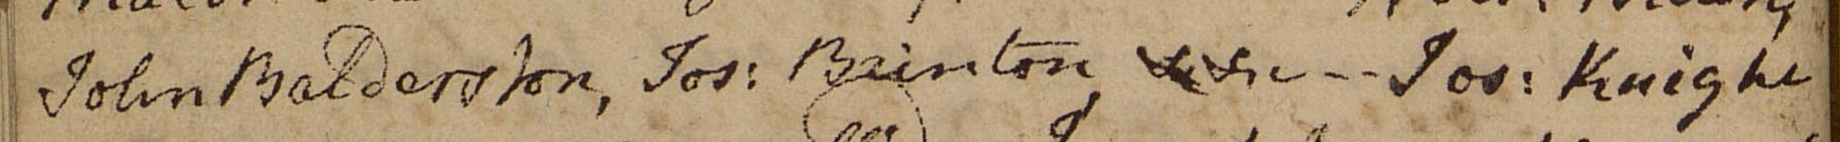John Balderston, Jos: Brinton &c &c -- Jos: Knight
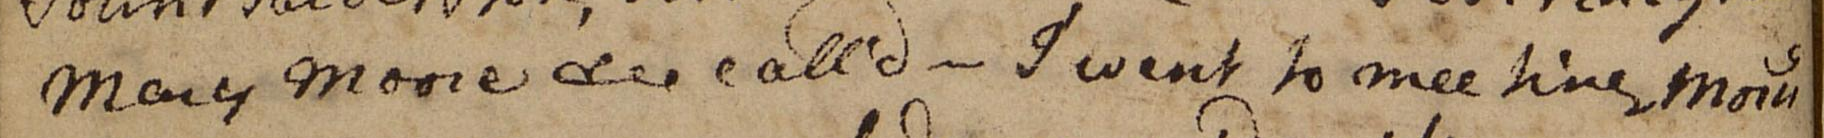Mary Moore &c call'd- I went to meeting morn^g
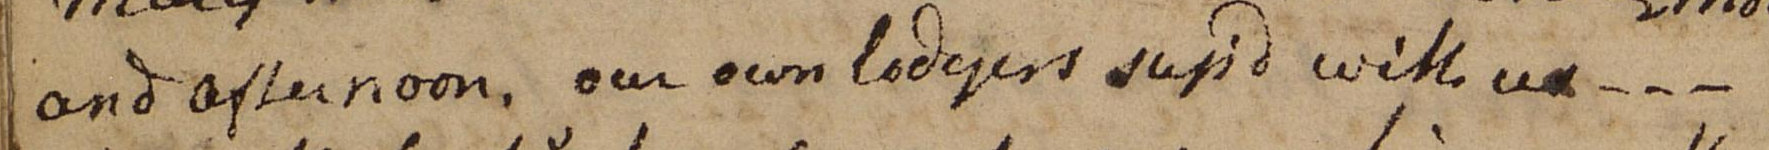and afternoon, our own lodgers sup'd with us---
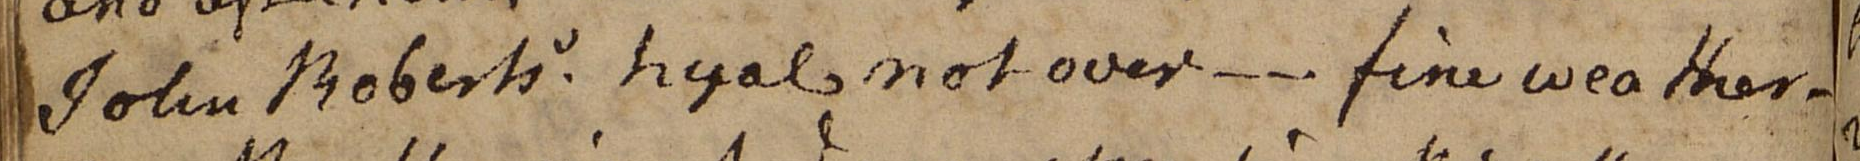John Roberts^s tryal not over- fine weather-
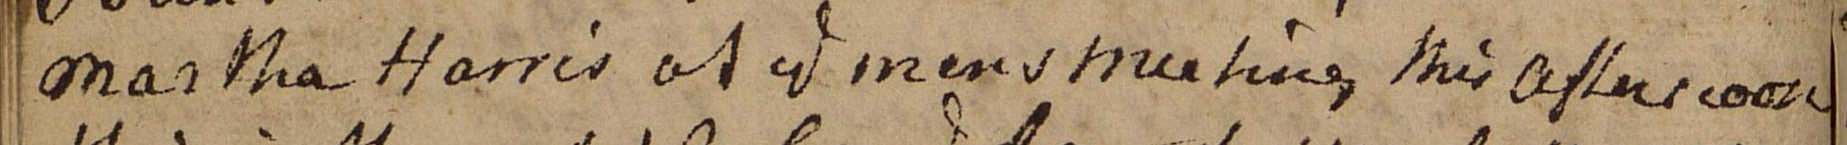Martha Harris at y^e mens meeting this Afternoon
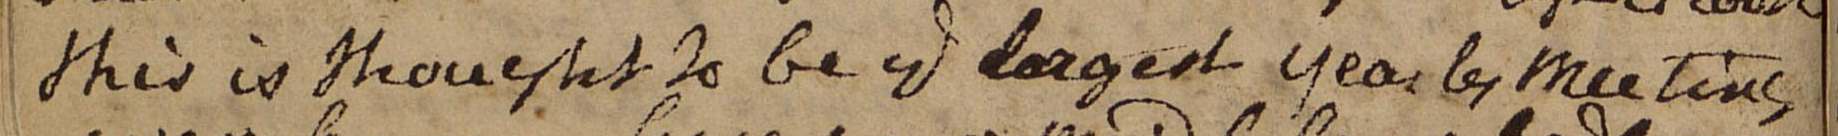this is thought to be y^e largest yearly meeting
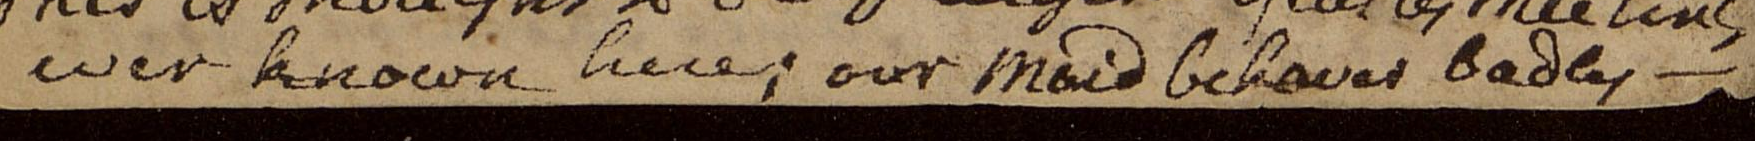ever known here; our maid behaves badly-
